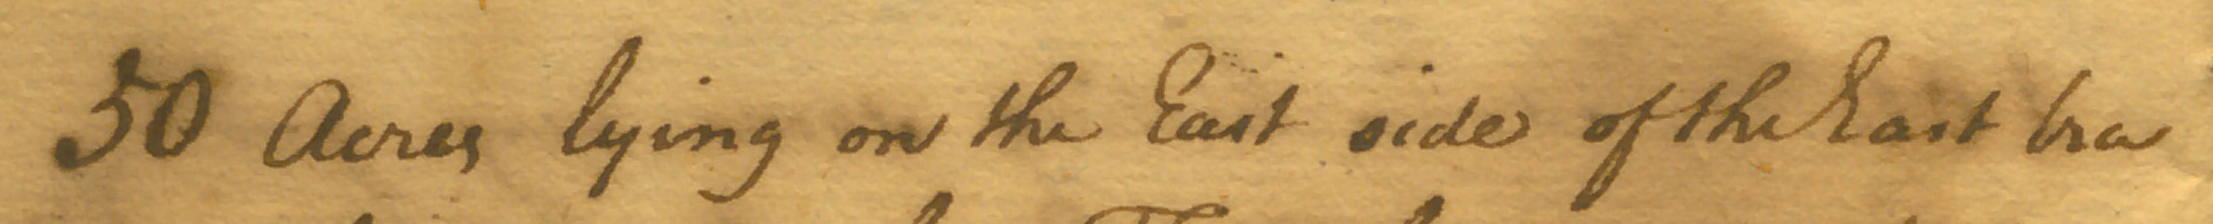50 acres lying on the East side of the East bra
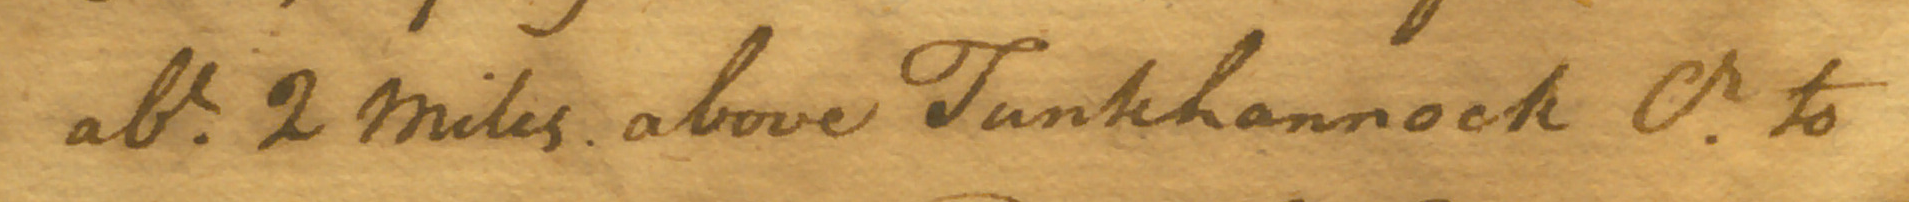ab^t. 2 miles above Tunkhannock C^r. to
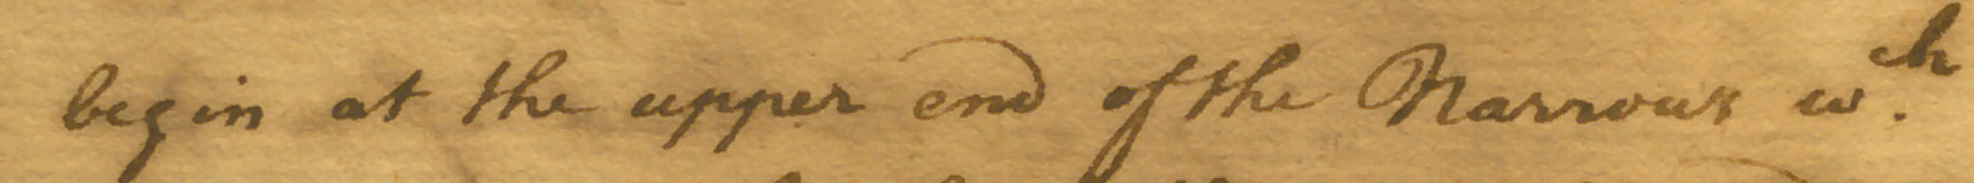begin at the upper end of the Narrows w^ch.
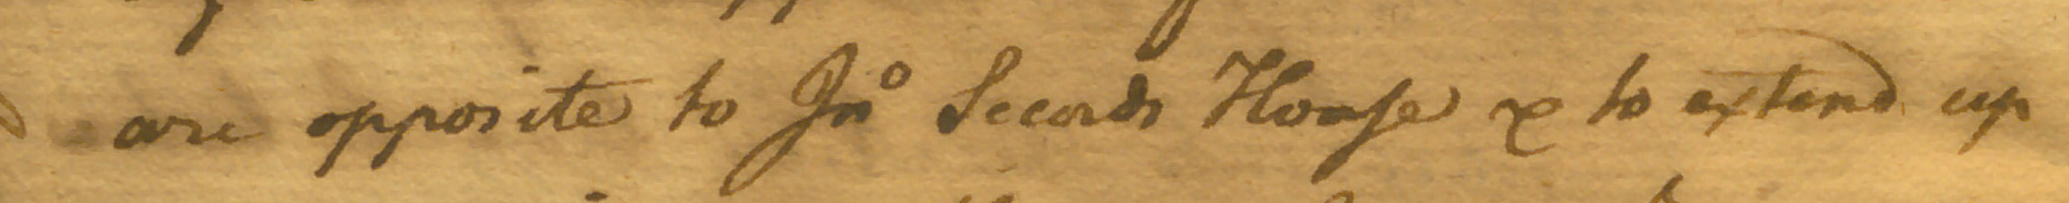are opposite to Jn^o Secords House & to extend up
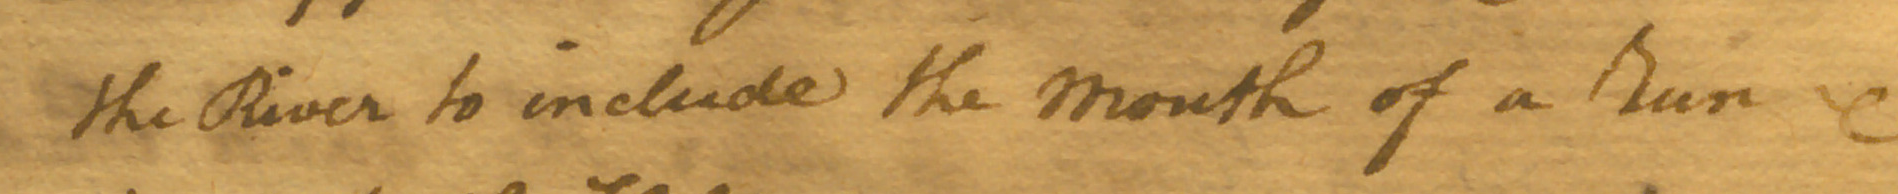the River to include the mouth of a run &
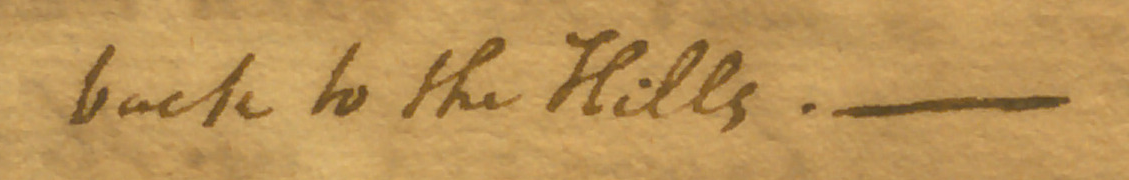back to the Hills.-
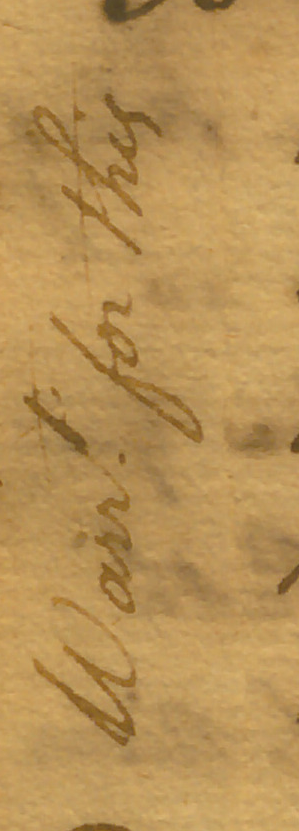Warr^t. for this
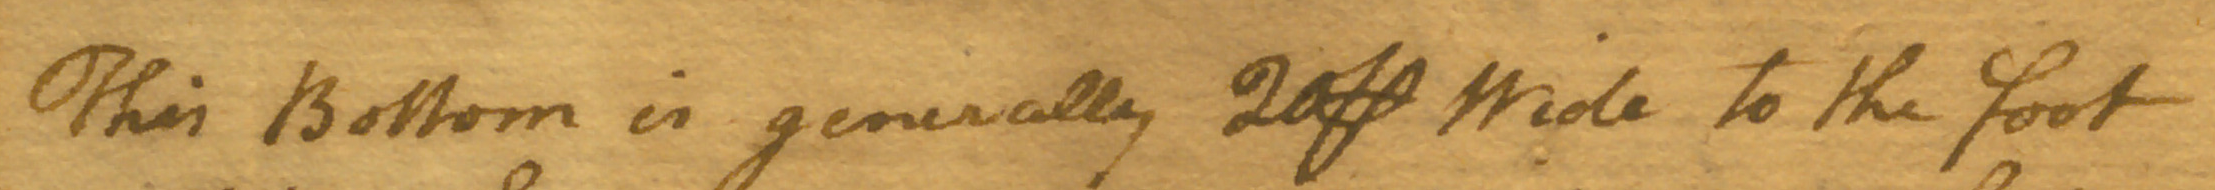This Bottom is generally 20 per Wide to the foot
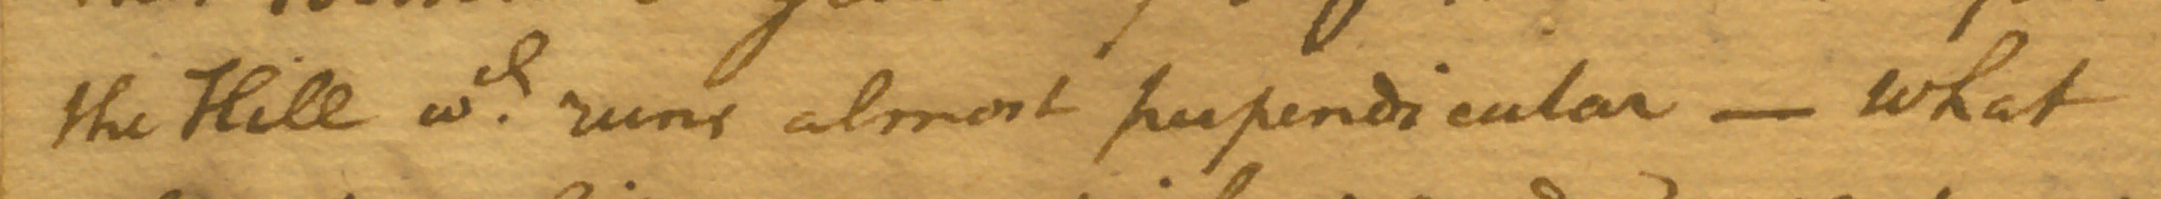the Hill w^ch. runs almost perpendicular- what
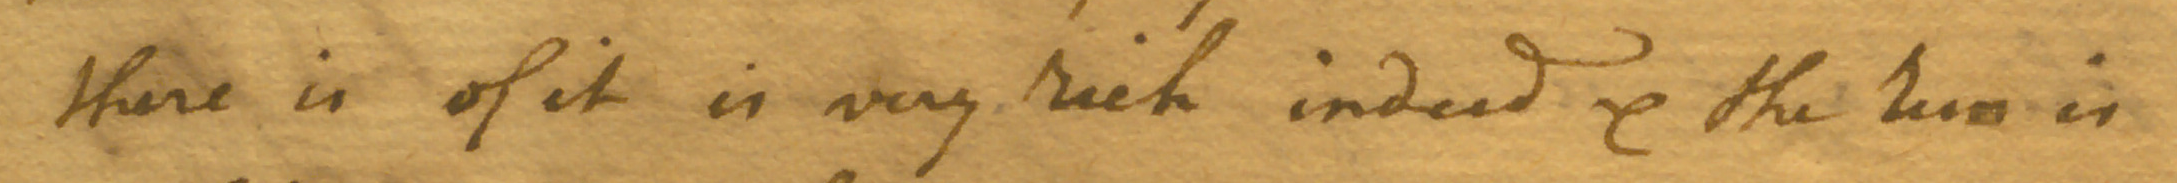there is of it is very rich indeed & the run is
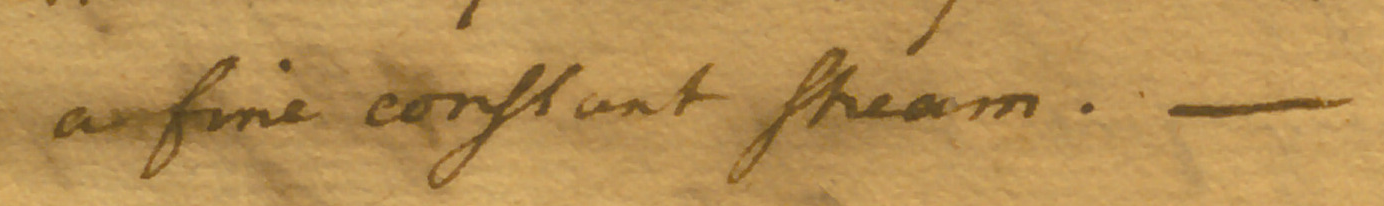a fine constant stream.-
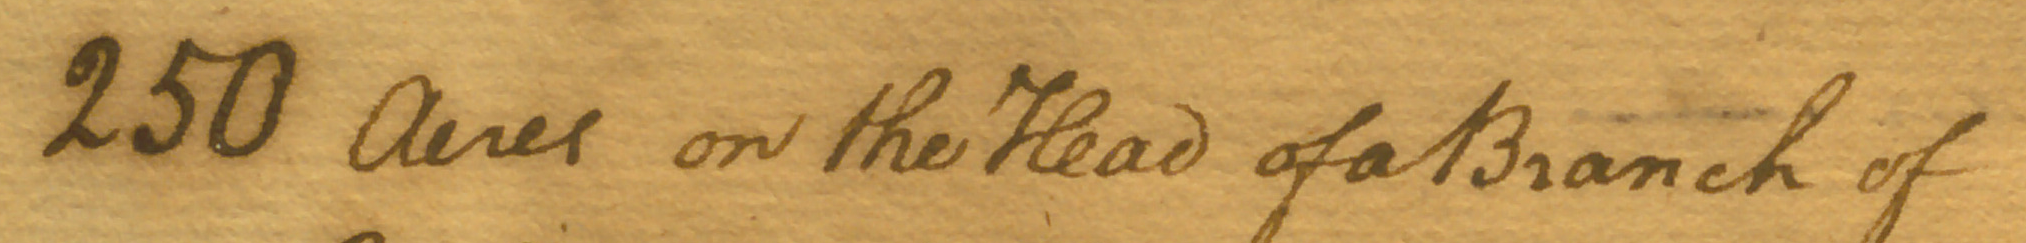250 Acres on the Head of a Branch of
